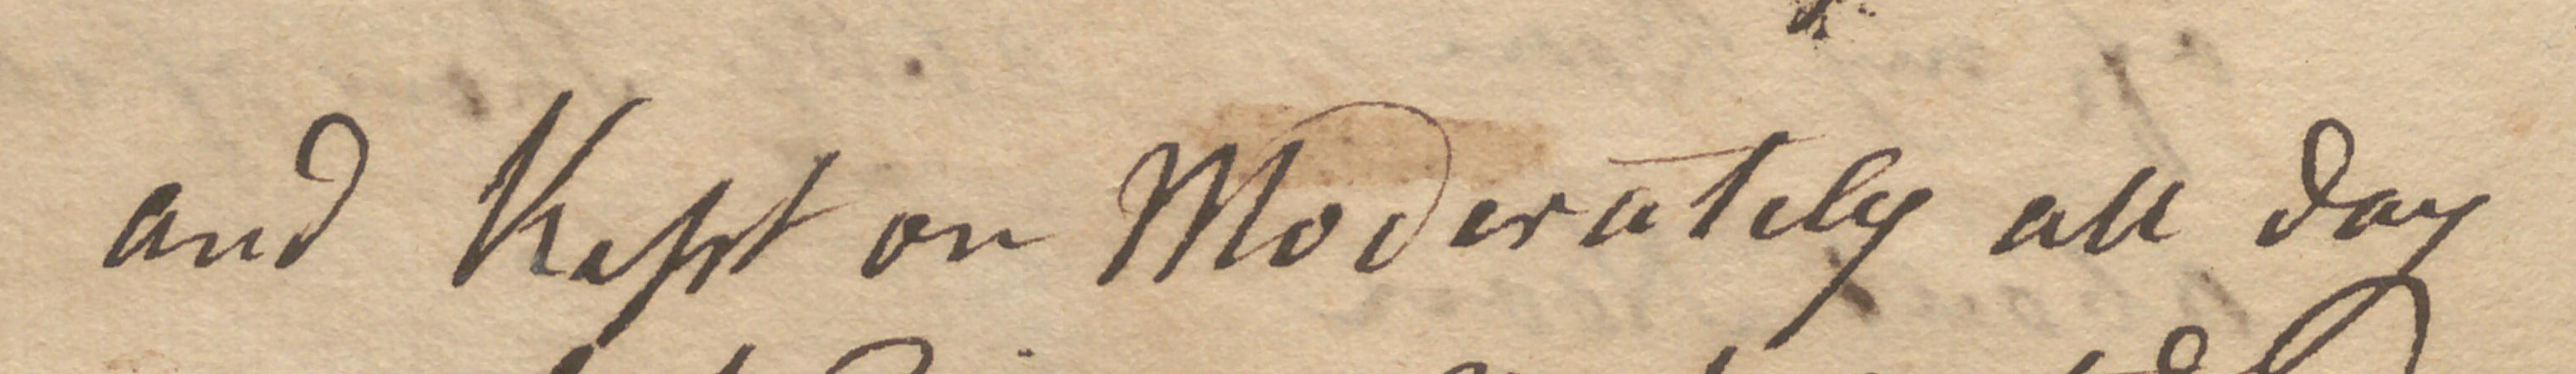and kept on Moderately all day
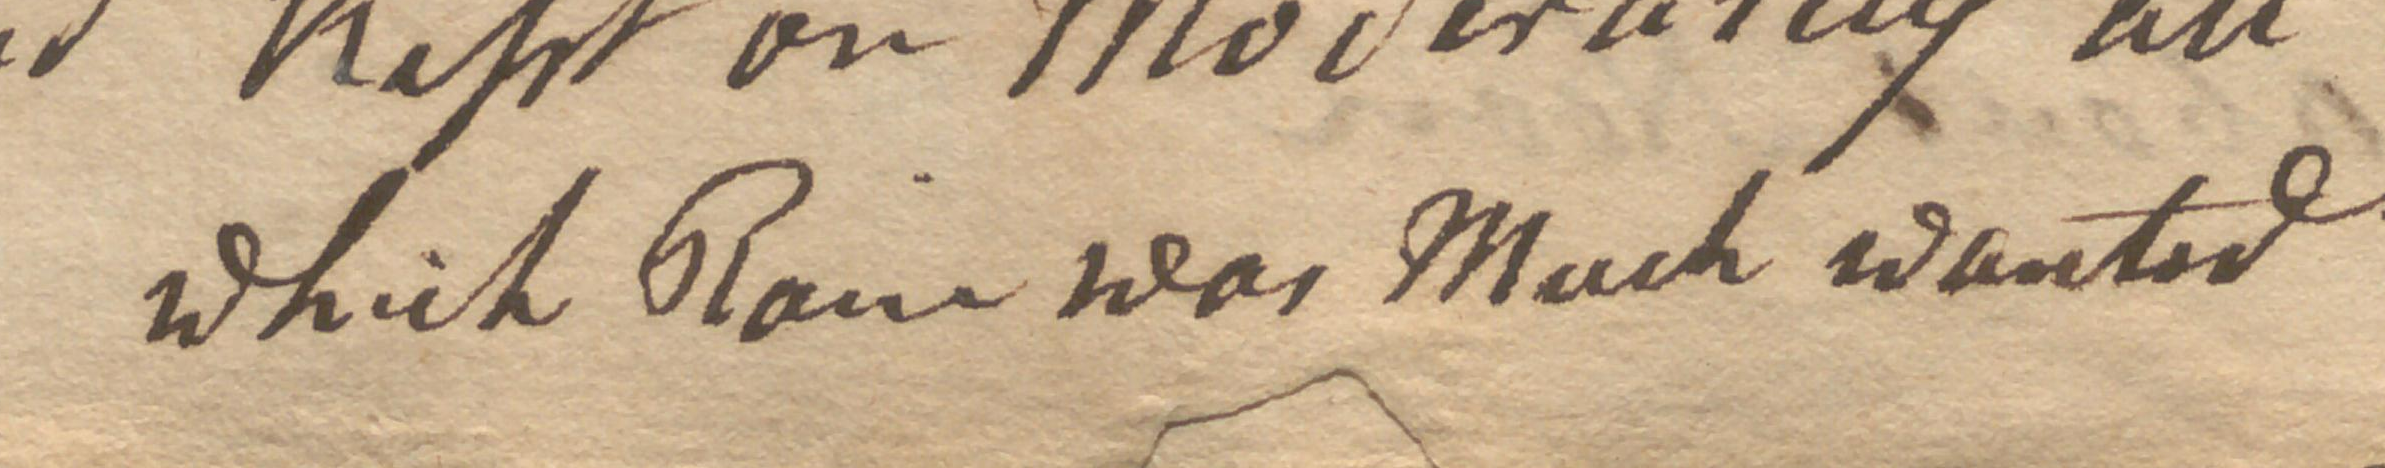which Rain was Much wanted
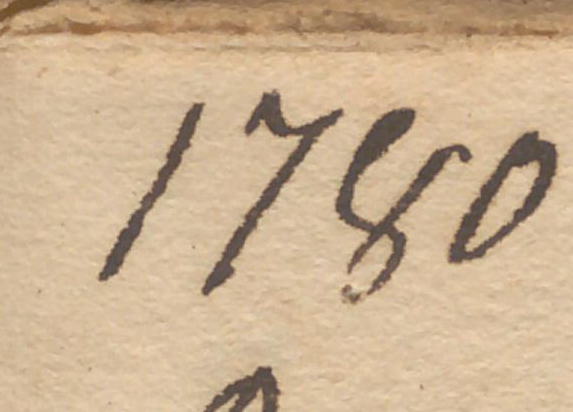1780
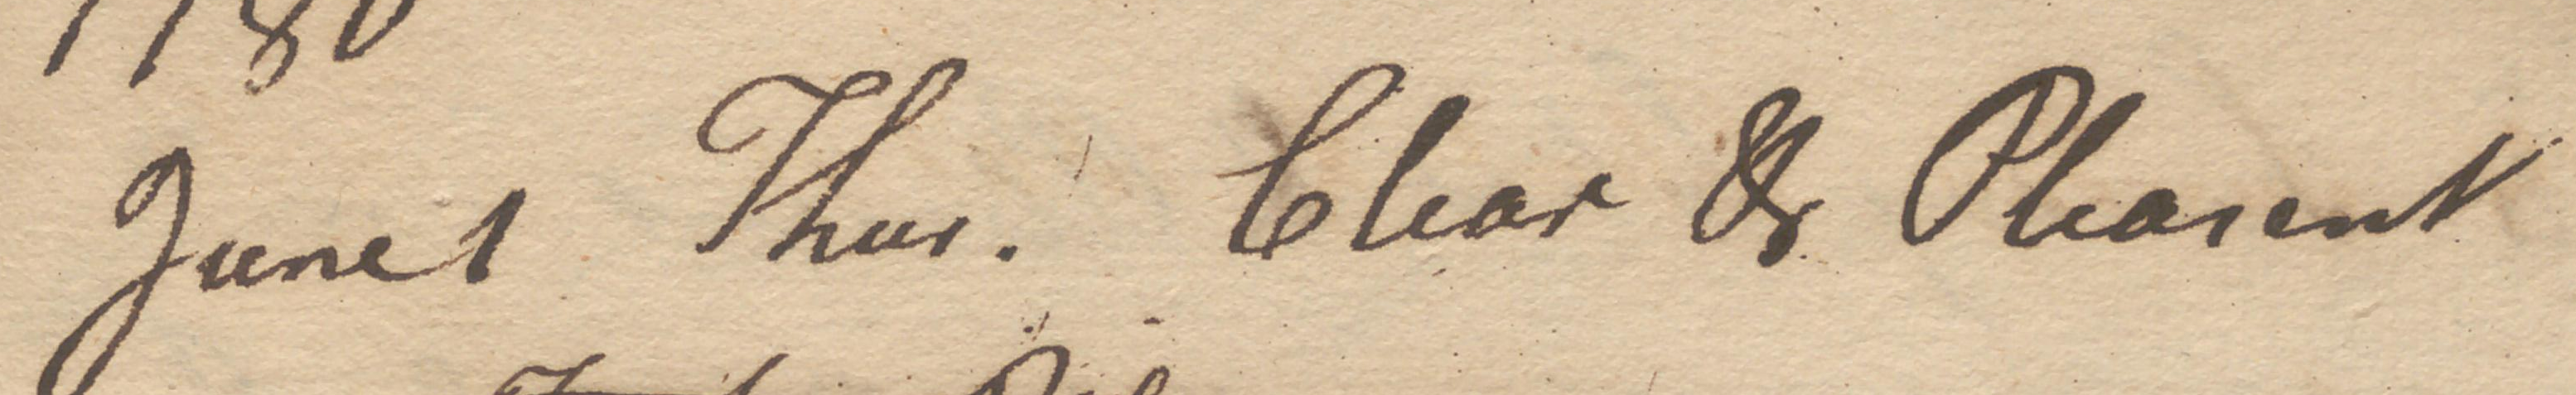June 1 Thus. Clear & Pleasent
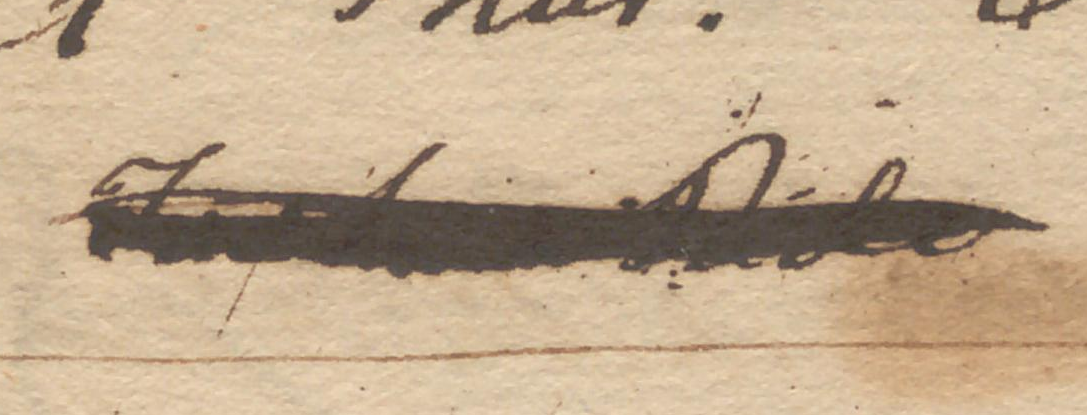[Took a Ride]
